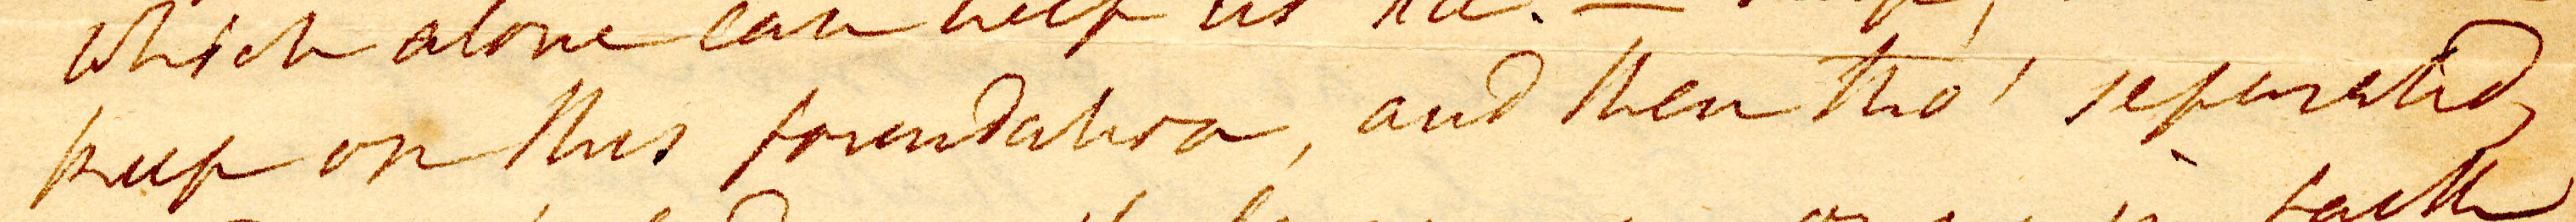keep on this foundation, and then tho' separated,
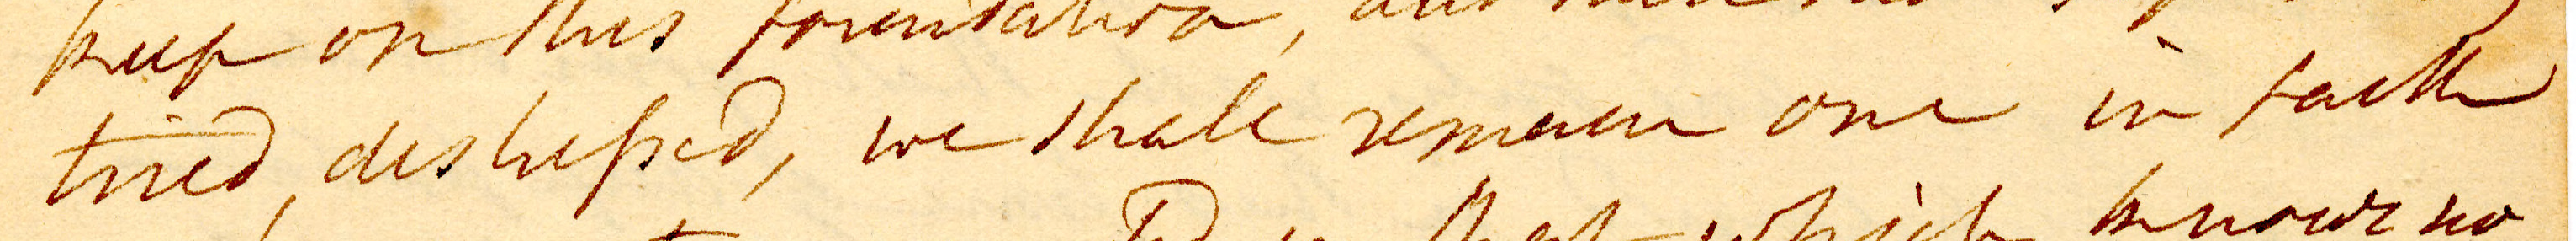tired, distressed, we shall remain one in faith
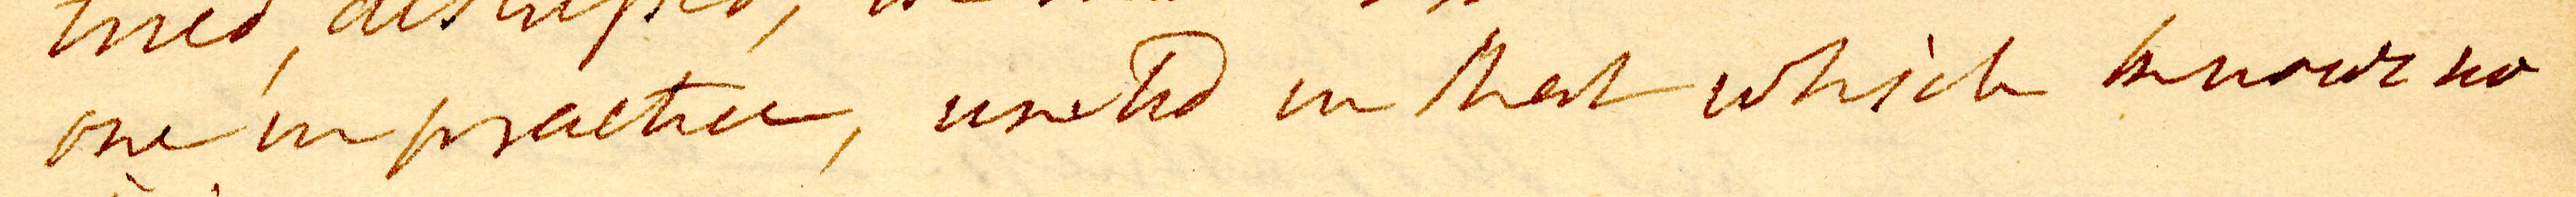one in practice, united in that which knows no
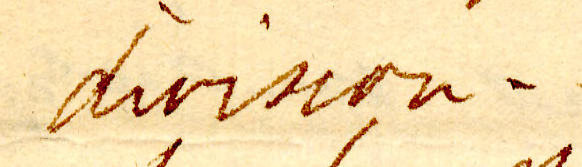division.-
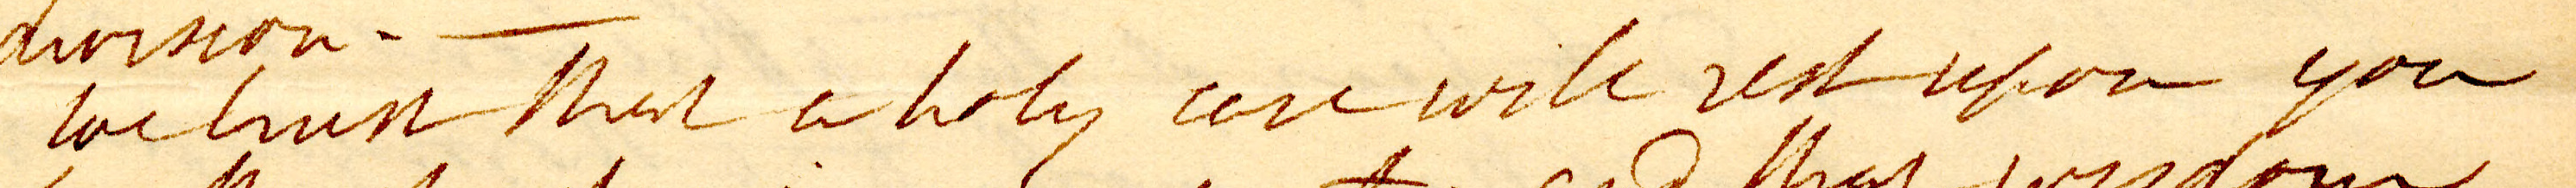We trust that a holy care will rest upon you
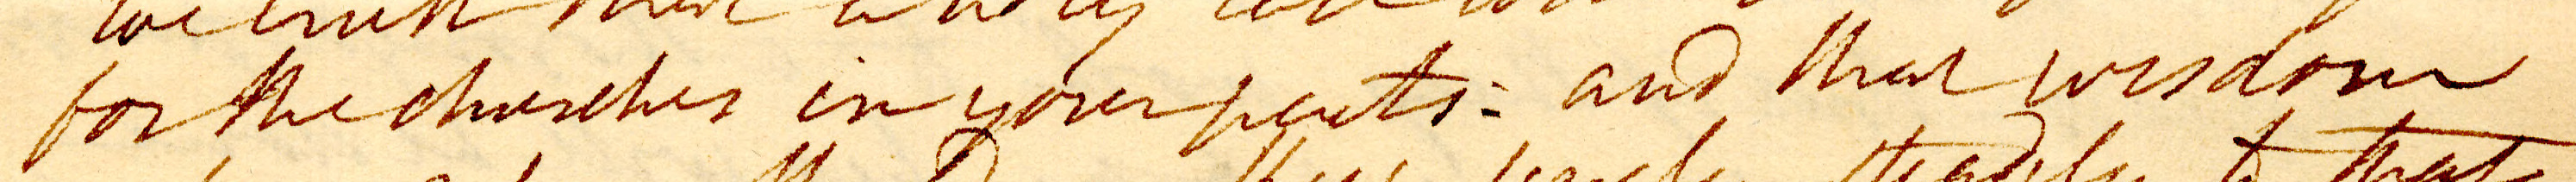for the churches in your parts: and that wisdom
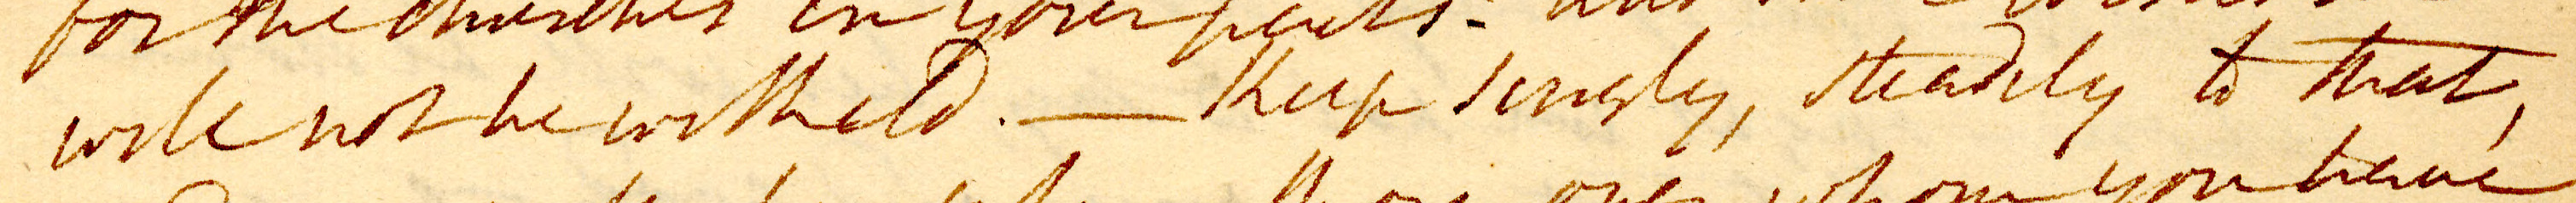will not be witheld.- Keep singly, steadily to that,
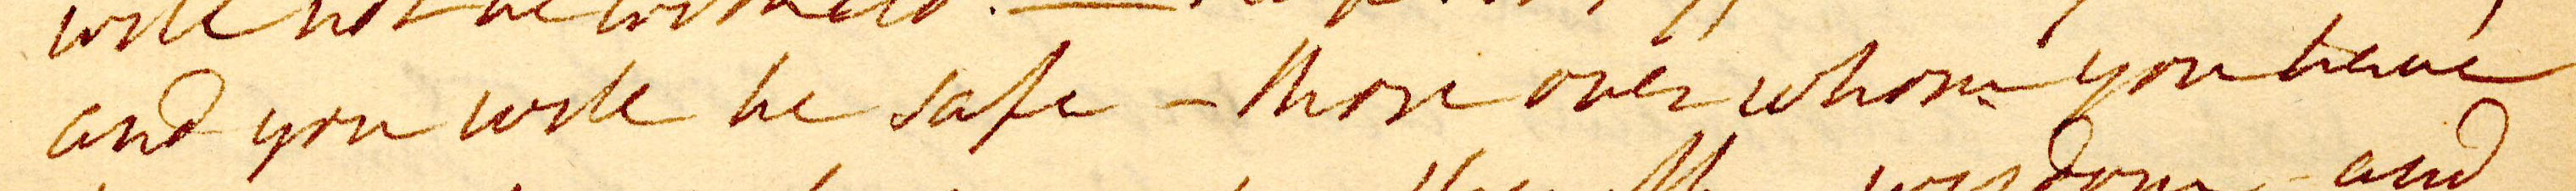and you will be safe- those over whom you have
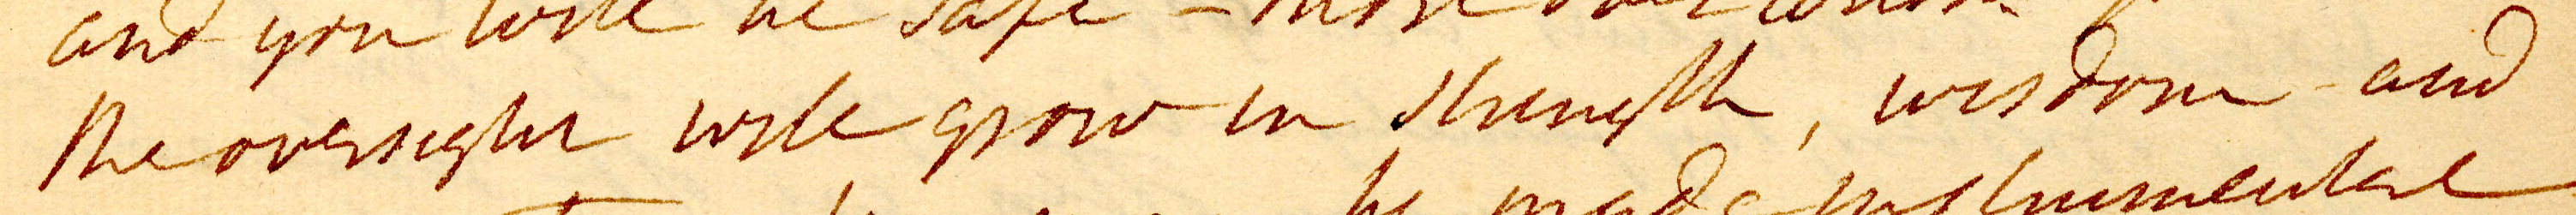the oversight will grow in strength, wisdom and
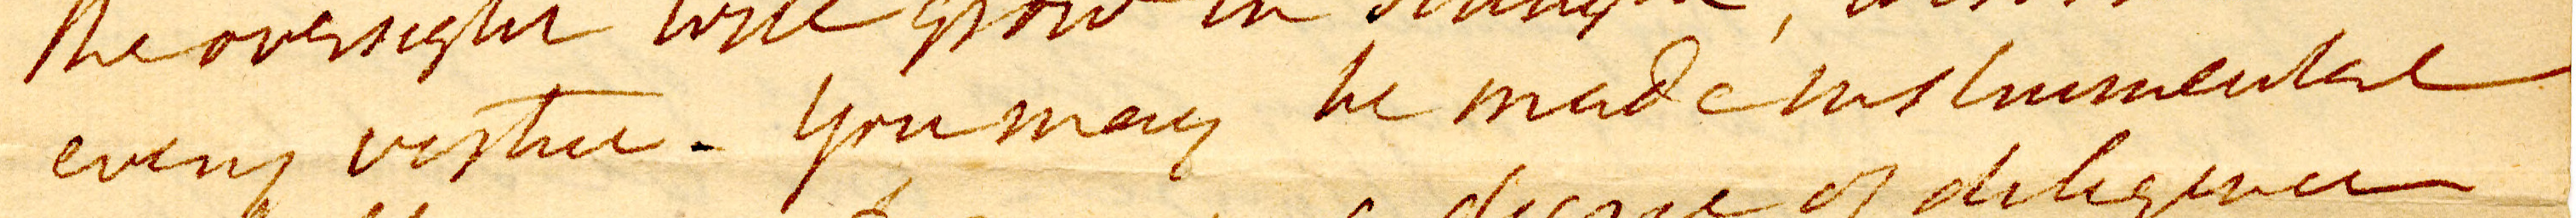every virtue. You may be made instrumental
